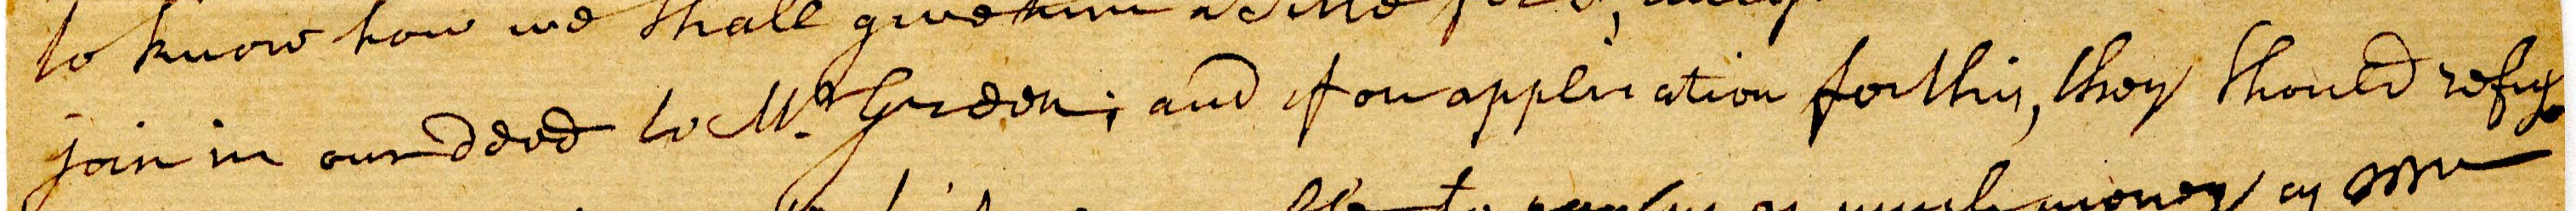join in our deed to M.^r Green; and if our application for this, they should refuse
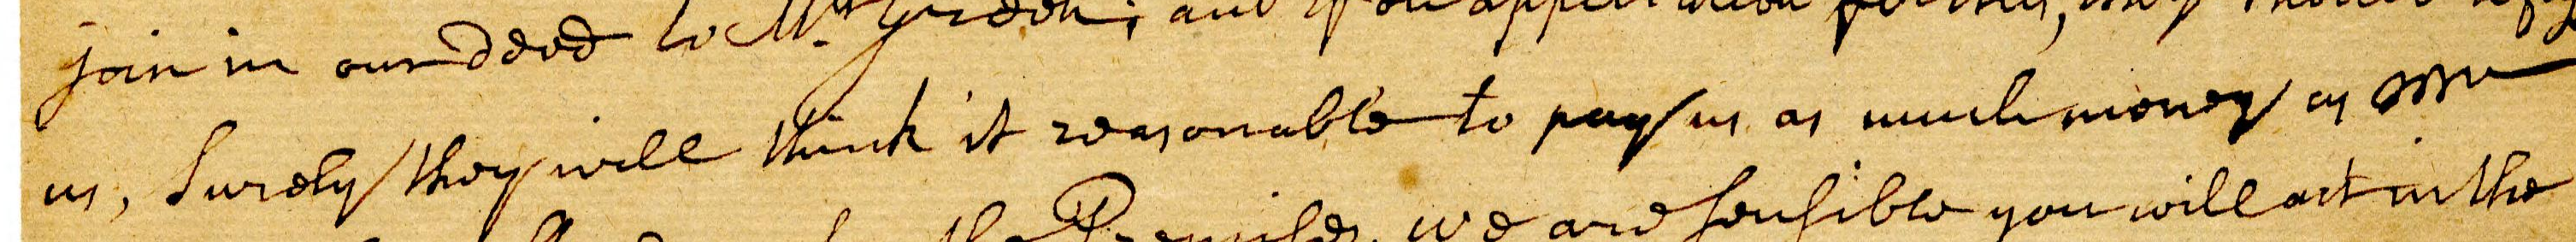us, surely they will think it reasonable to pay us as much money as M^r
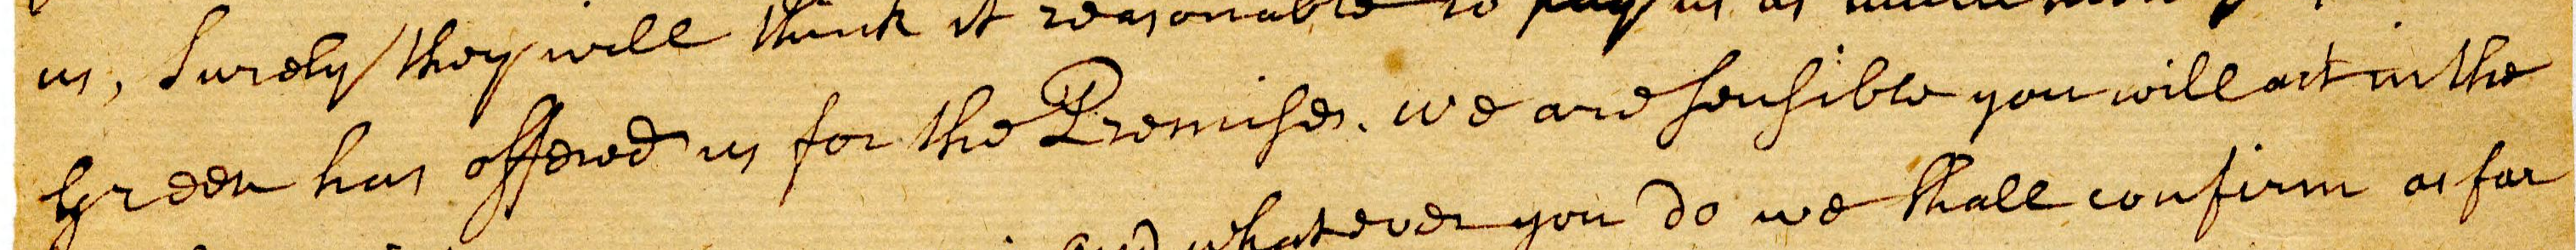Green has offered us for the Premises. We are sensible you will act in the
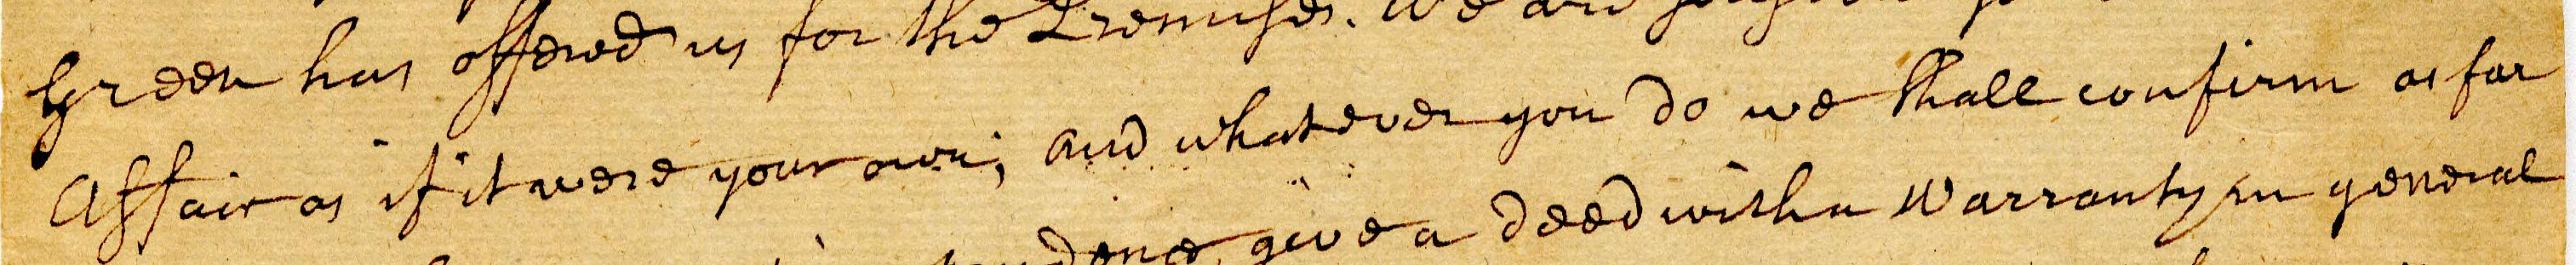Affair as if it were your own; and whatever you do we shall confirm as far
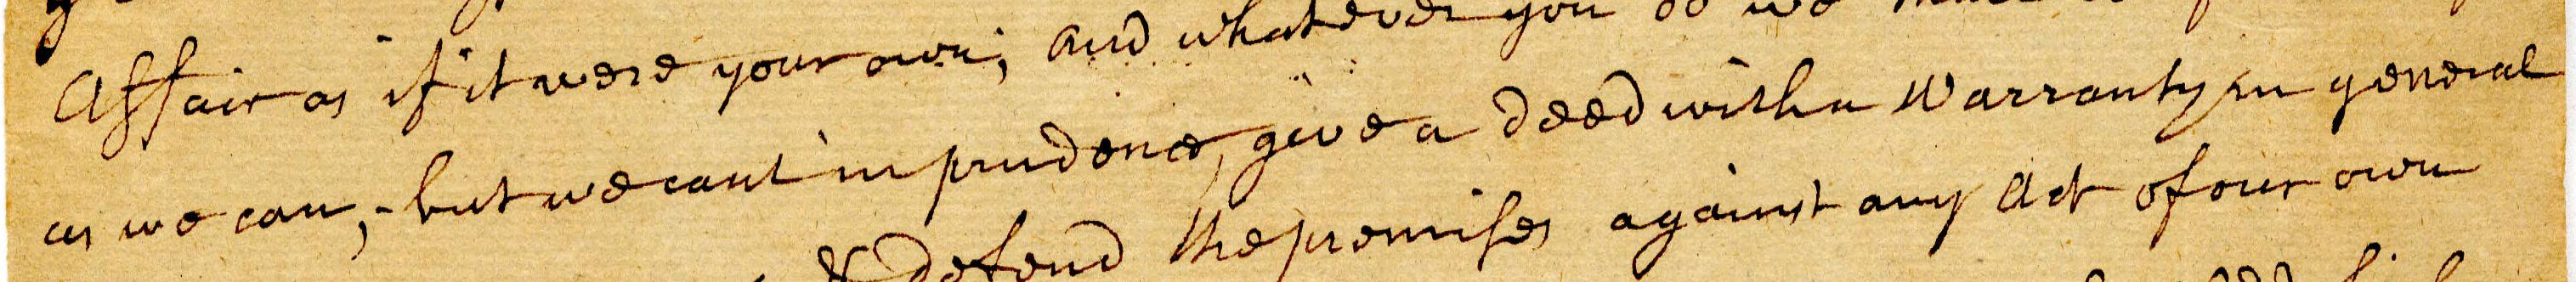as we can,- but we cant in prudence, give a deed withn Warranty in general
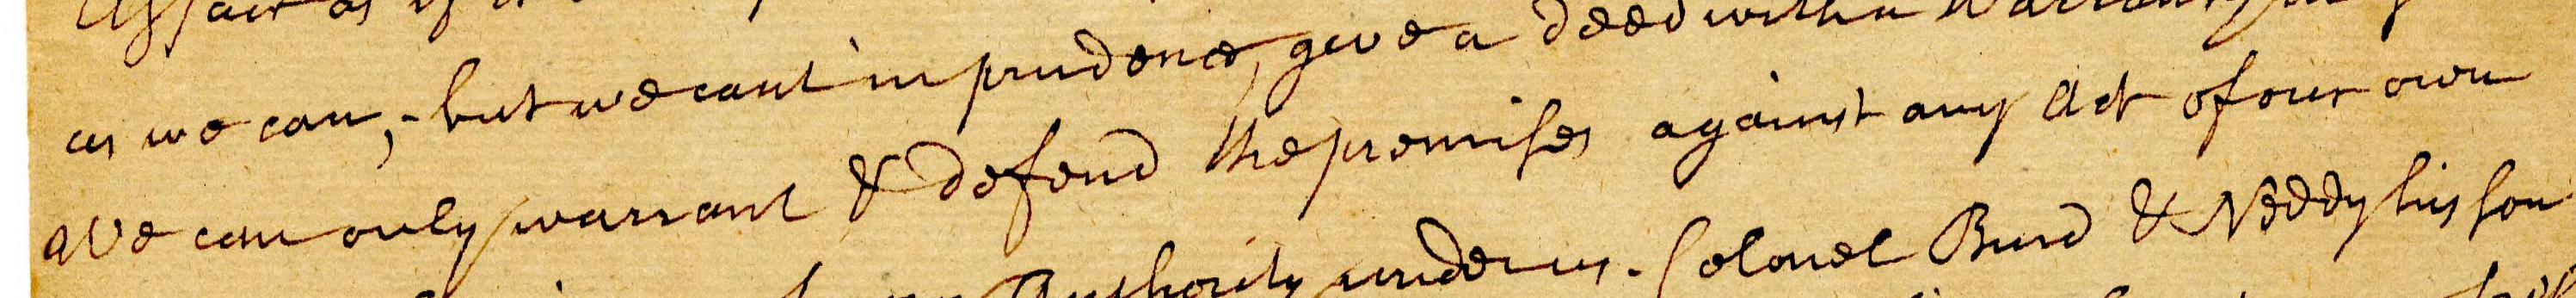We can only warrant & defend the premises against any Act of our own
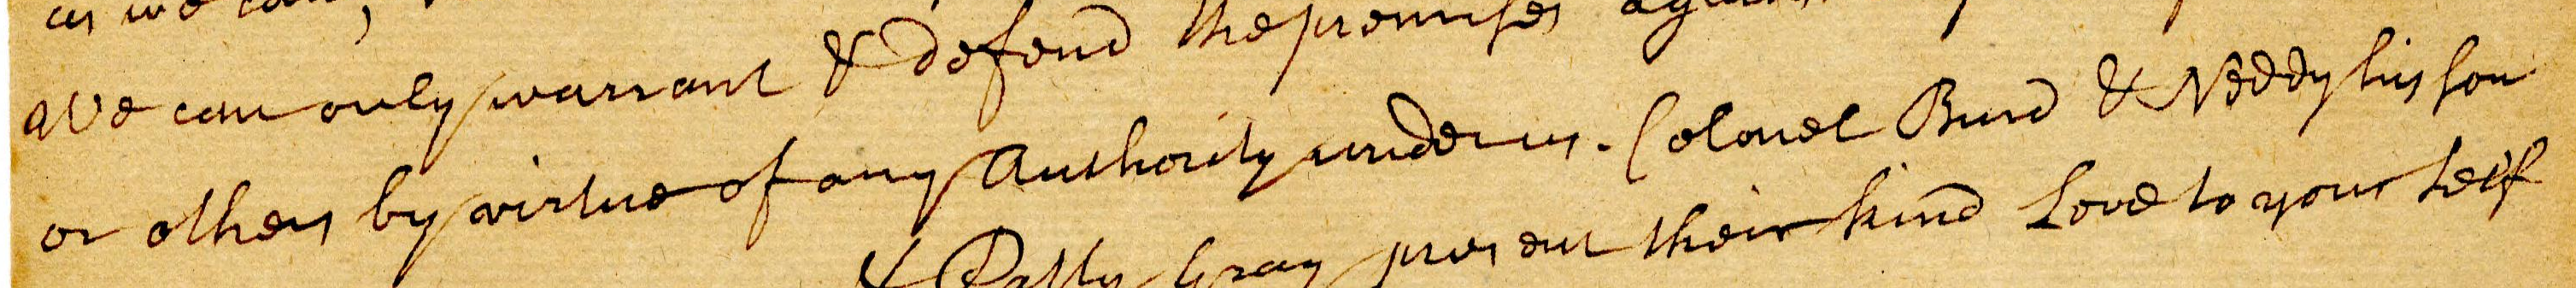or others by virtue of any Authority under us. Colonel Burd & Neddy his son
